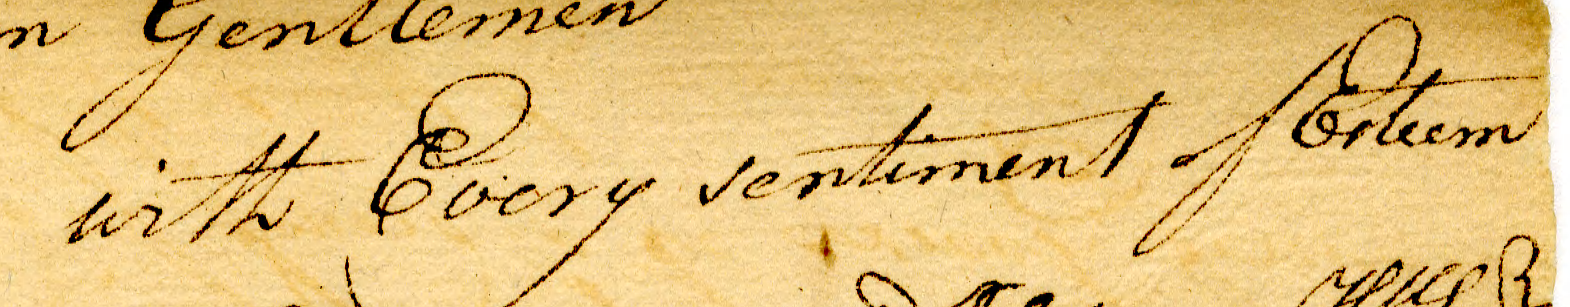with Every sentiment of Esteem
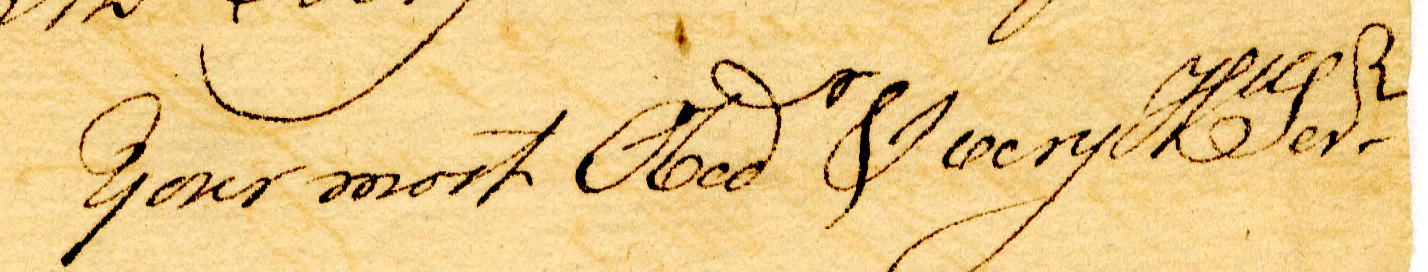Your most Obed^t & very H^bl Serv^t.
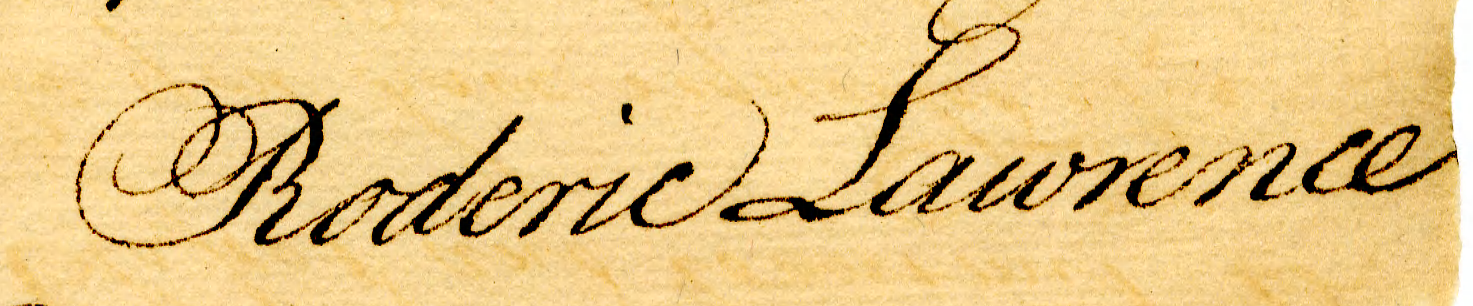Roderic Lawrence
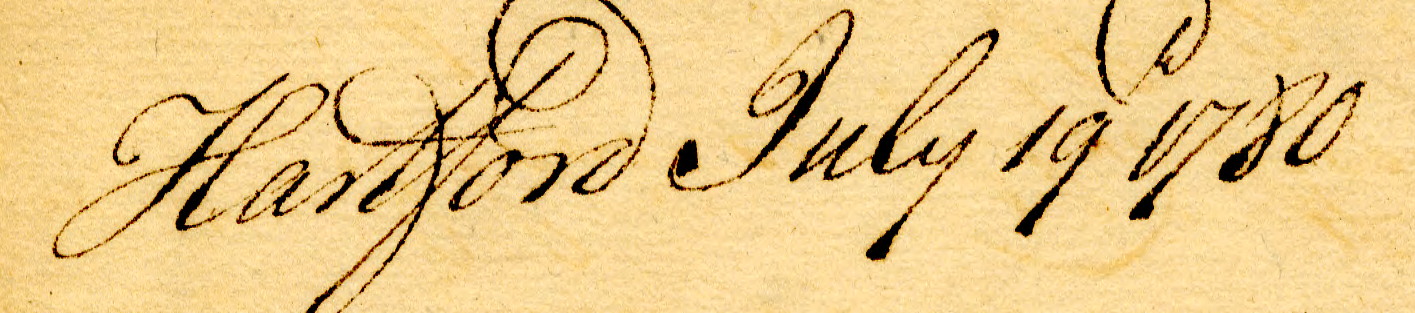Hartford July 19^th 1780
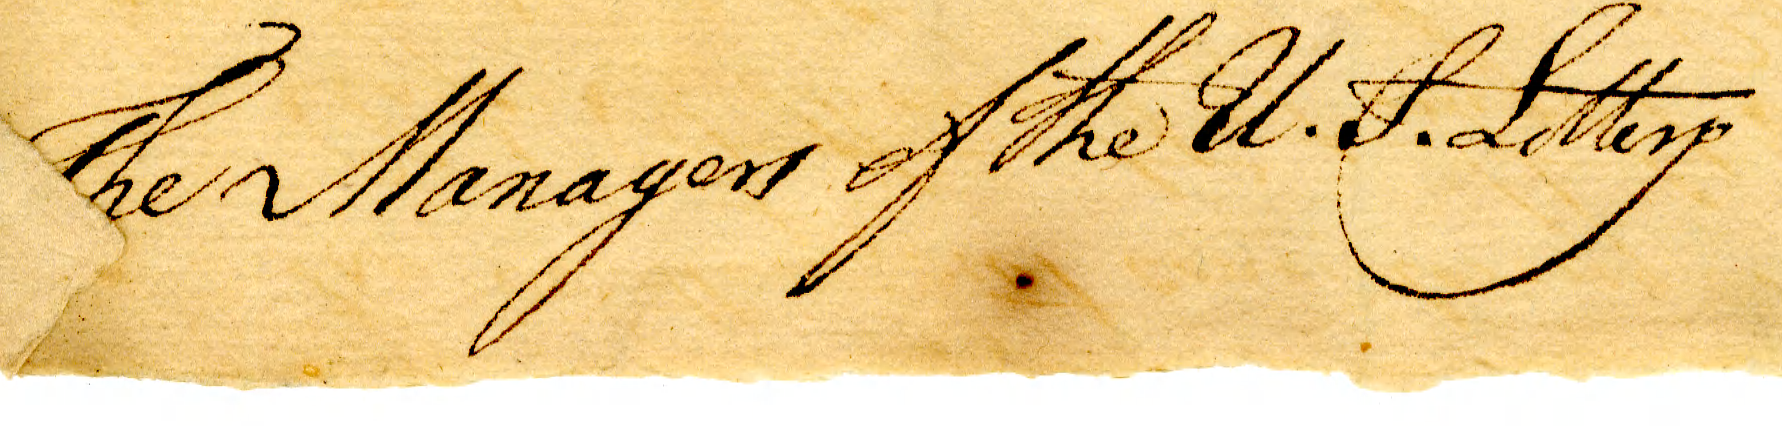The Managers of the U.S. Lottery
